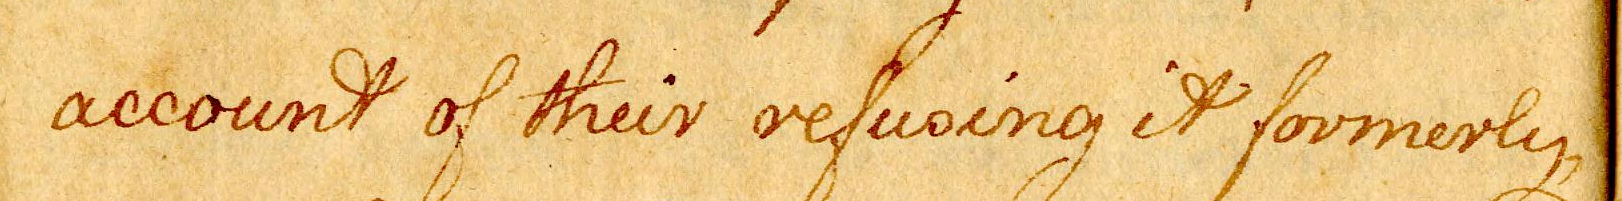account of their refusing it formerly,
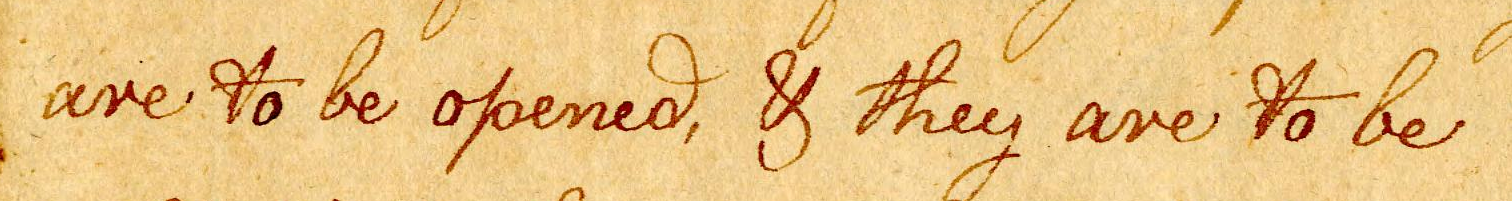are to be opened, & they are to be
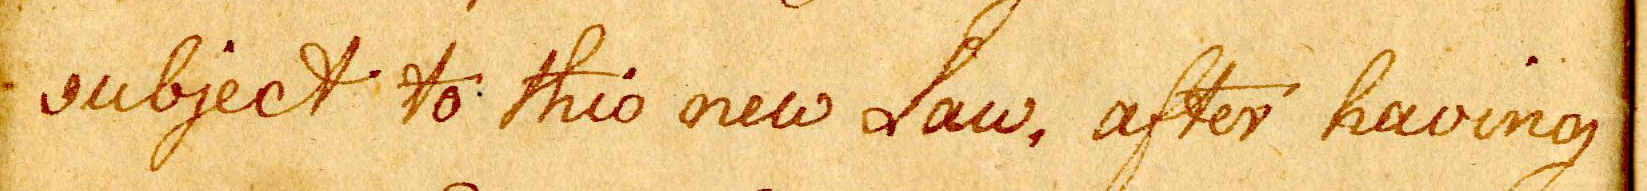subject to this new Law, after having
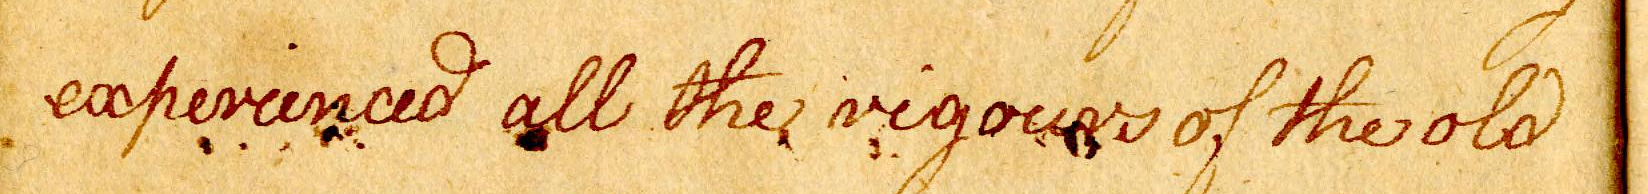experienced all the rigours of the old
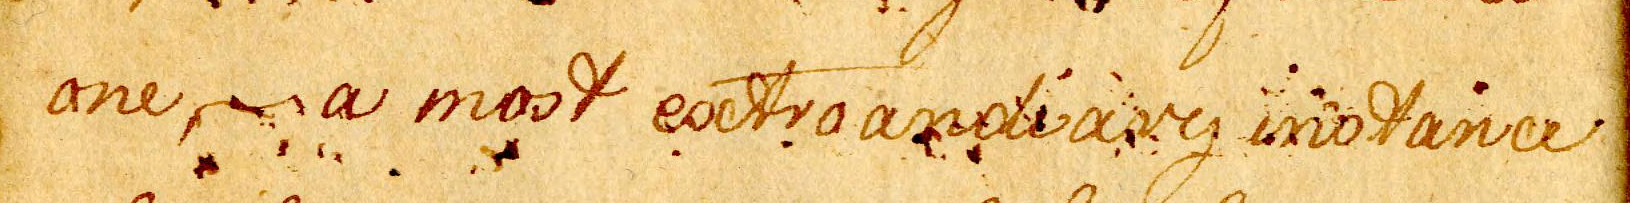one- a most extroandiary instance
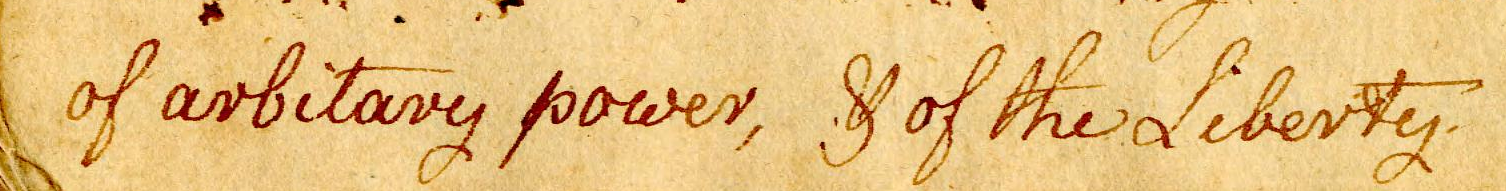of arbitrary power, & of the Liberty.
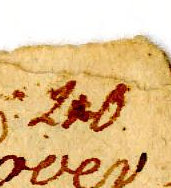40
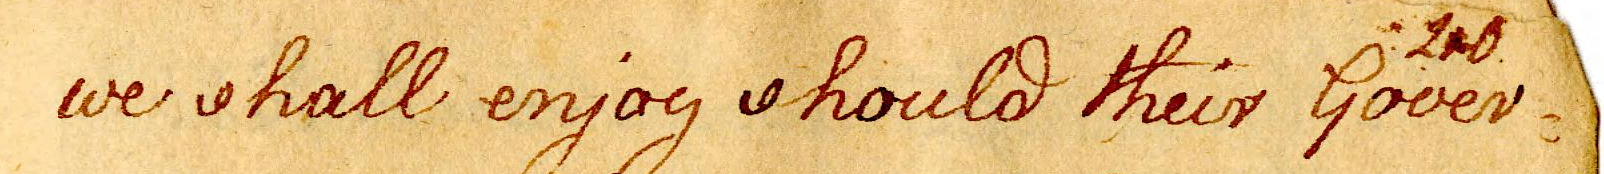we shall enjoy should their Gover-
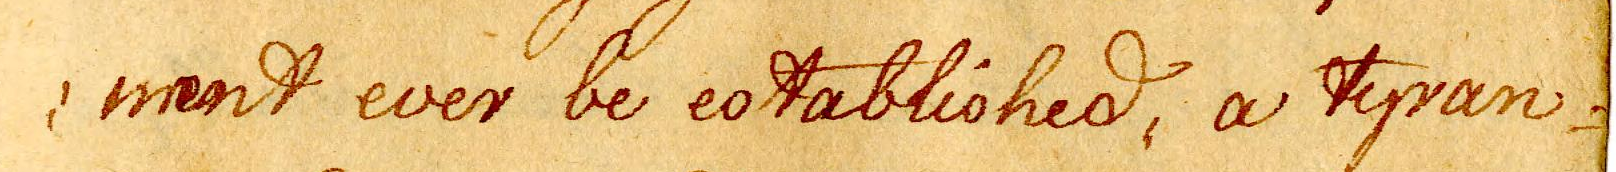-ment ever be established, a tyran-
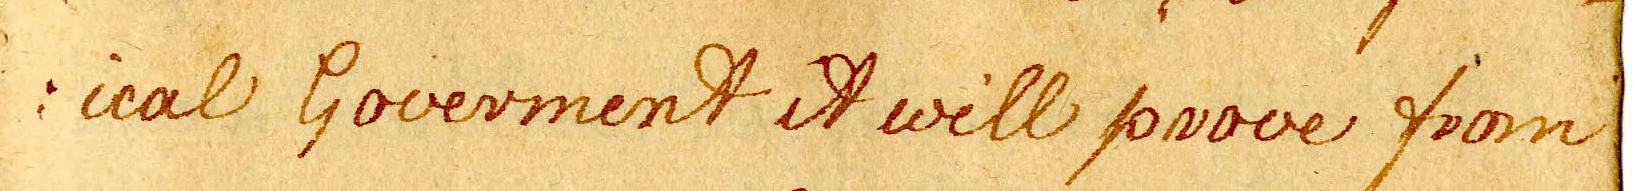-ical Government it will prove from
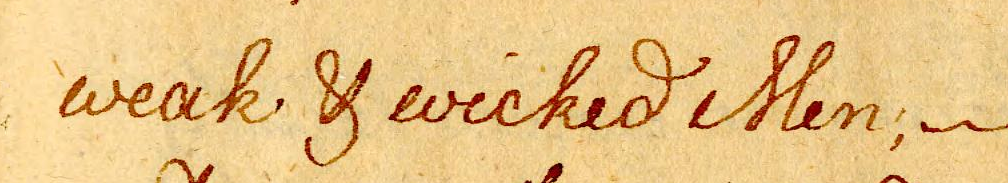weak & wicked Men,-
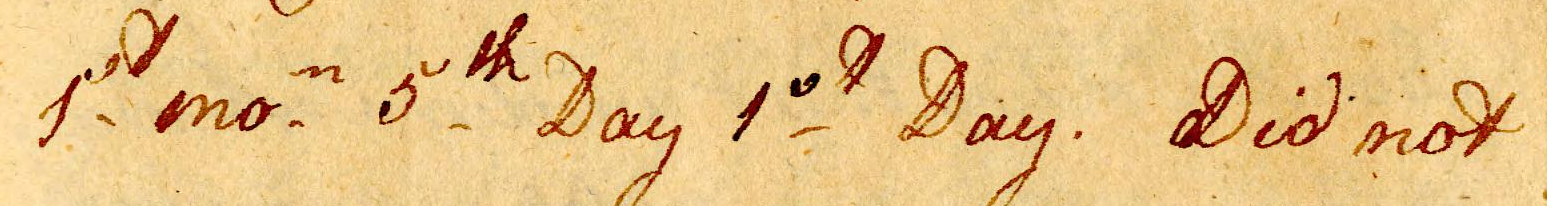1^st mo^n 5^th Day 1^st Day. Did not
